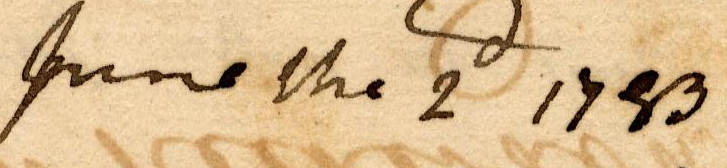June the 2^d 1783
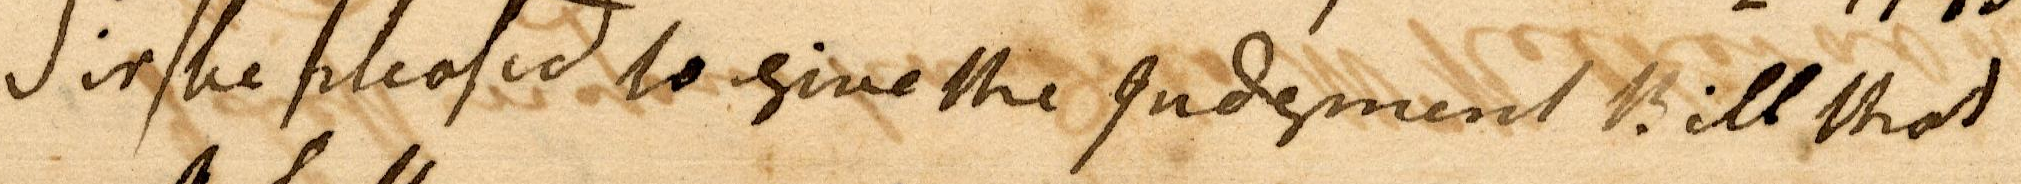Sir, be pleased to give the judgment Bill that
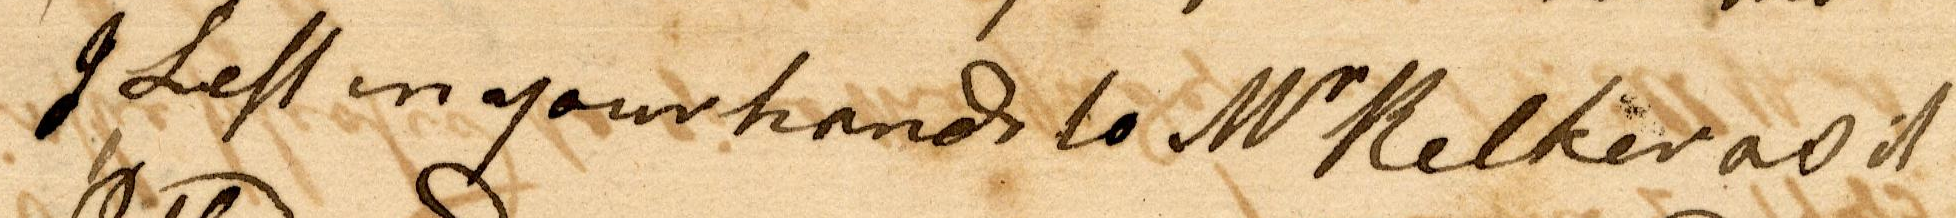I Left in your hands to M^r Relker as it
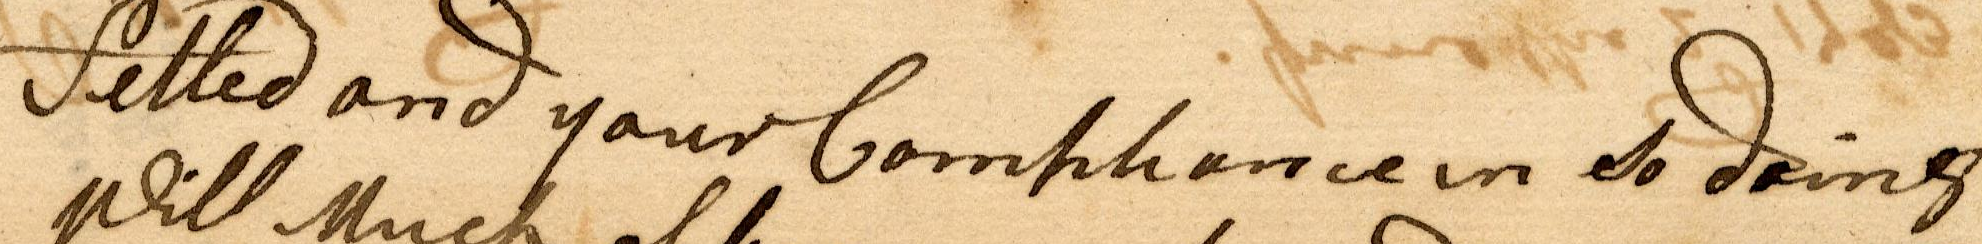Setled and your Compliance in so doing
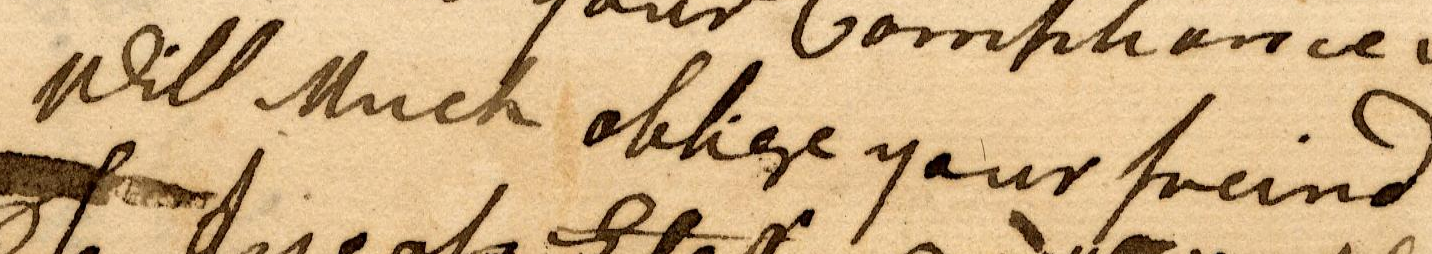will Much oblige your freind
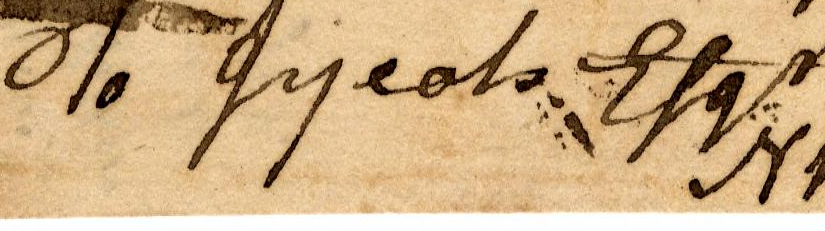To Jyeats Esq^r
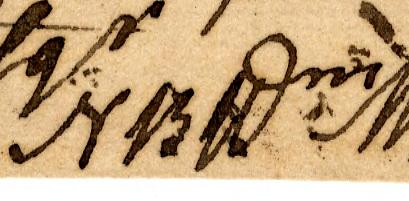NB W^m
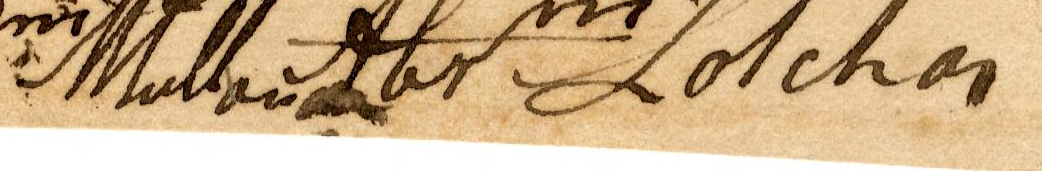Mullan Abr^m Lotchar
